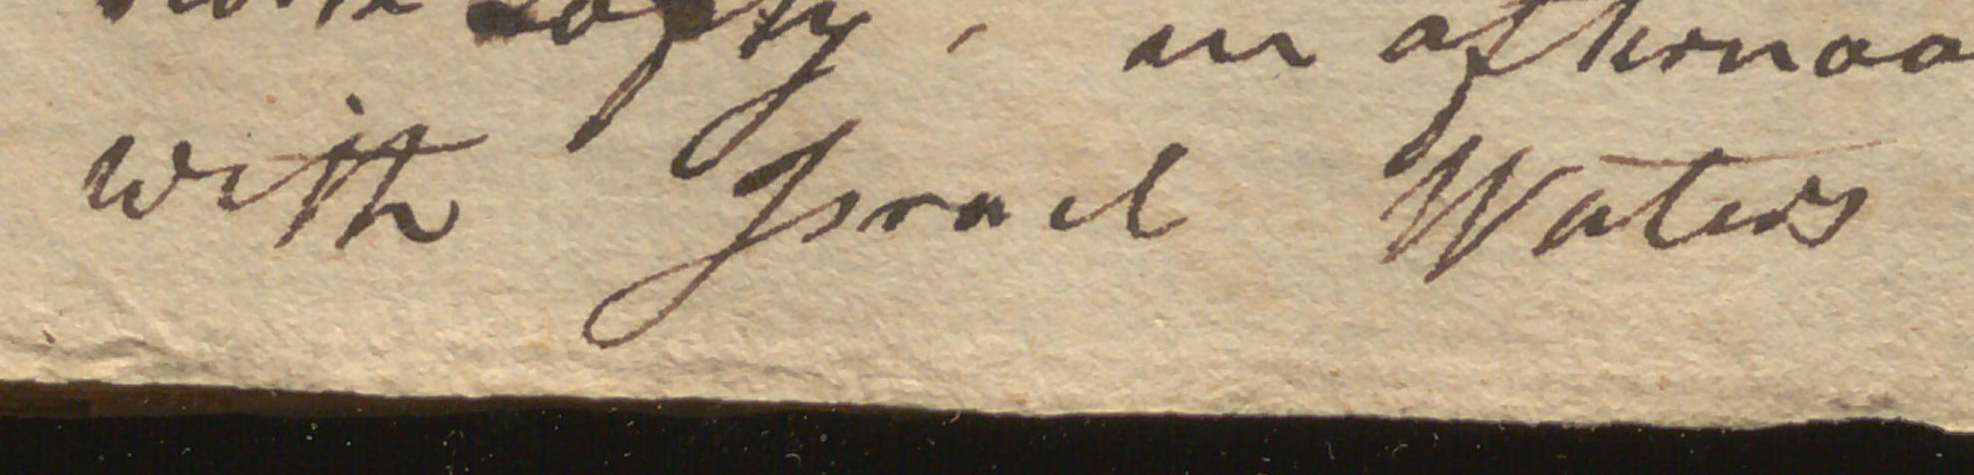with Israel Waters
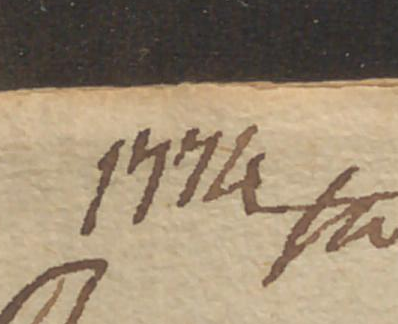1774
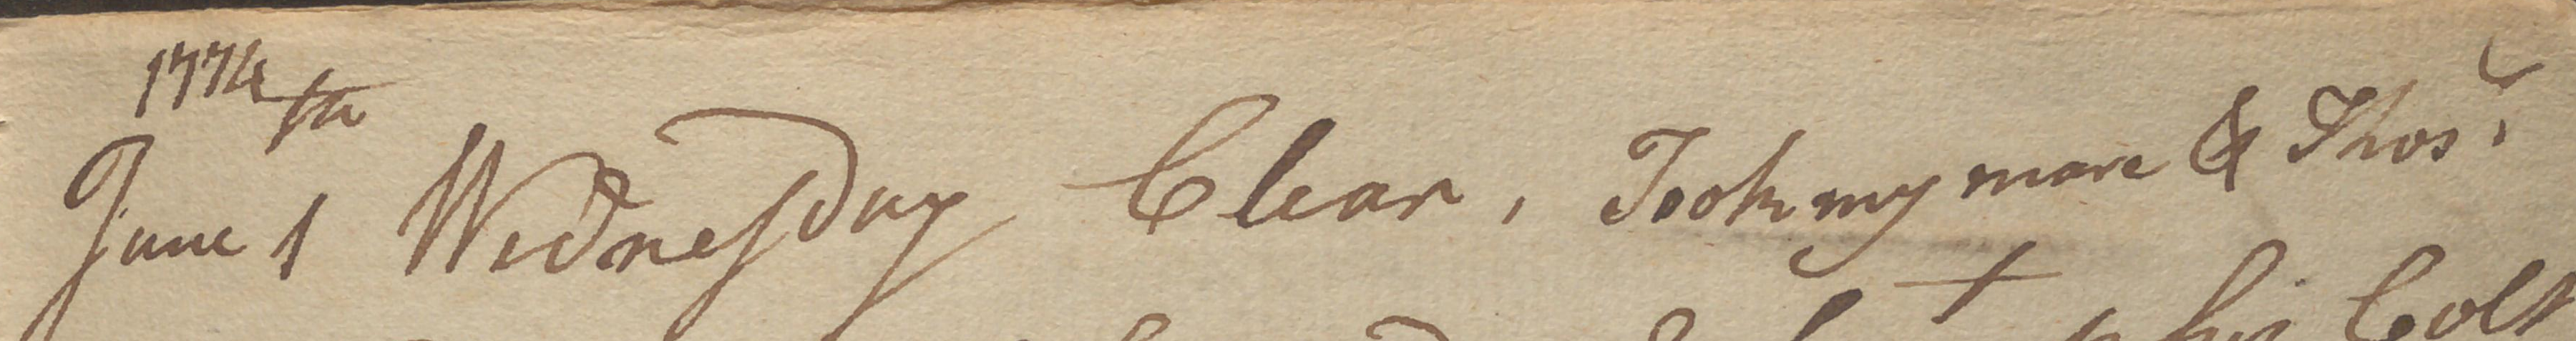June 1 Wednesday Clear, Took my mare & Thos^s.
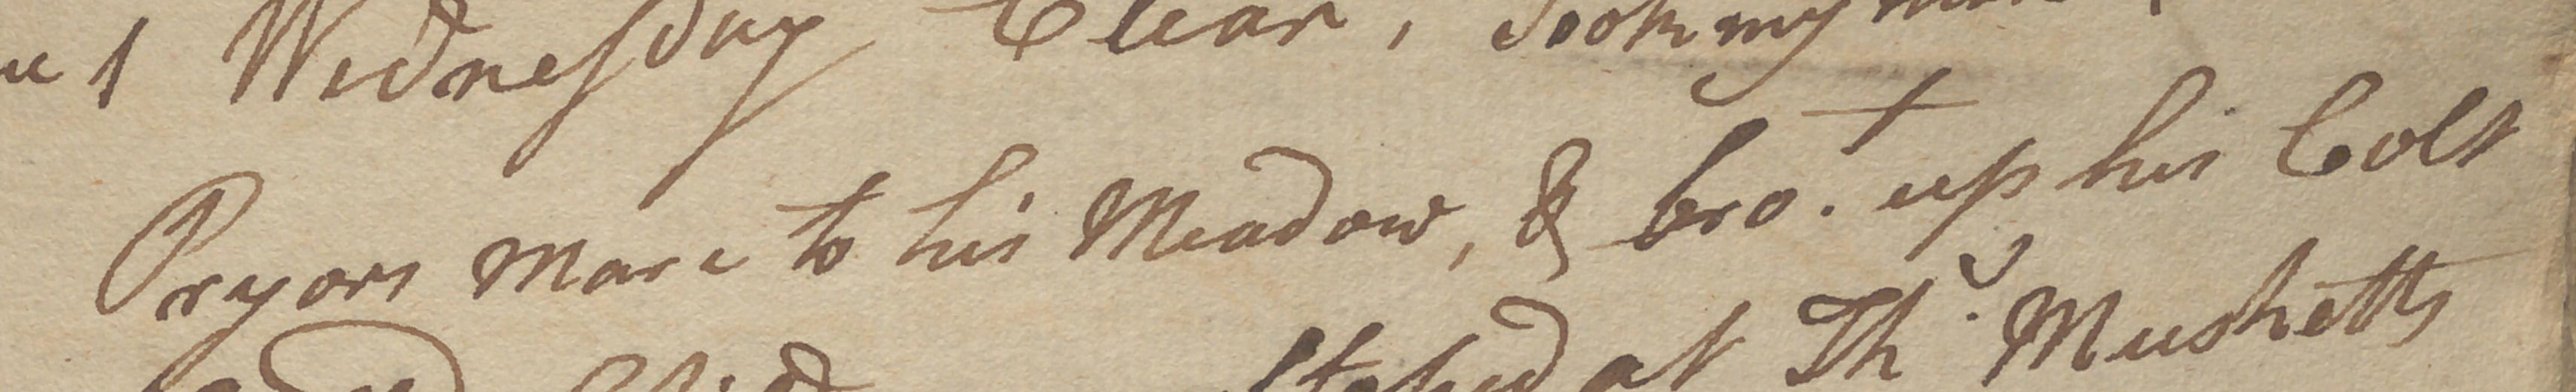Pryors mare to his Meadow, & bro^t. up his Colt
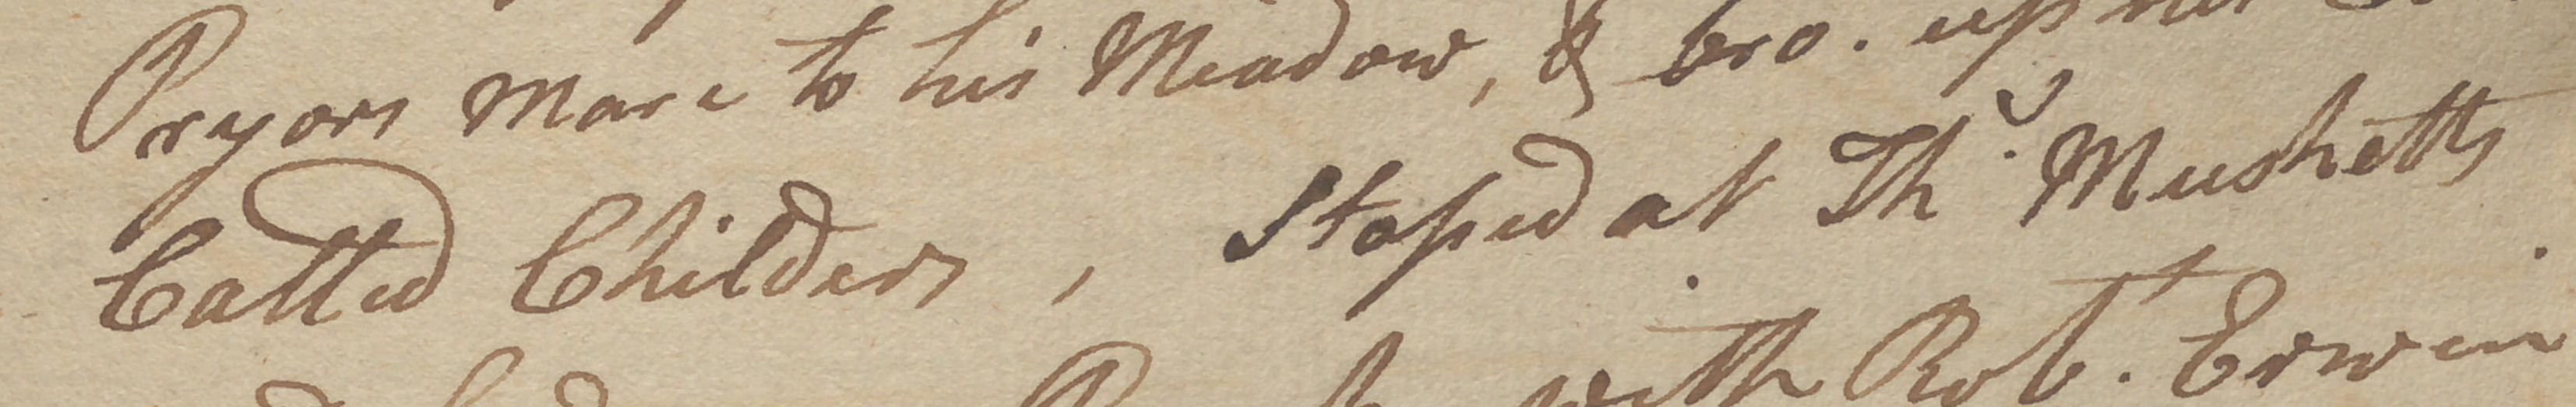Catted Childers, Stoped at Th^s. Mushetts
